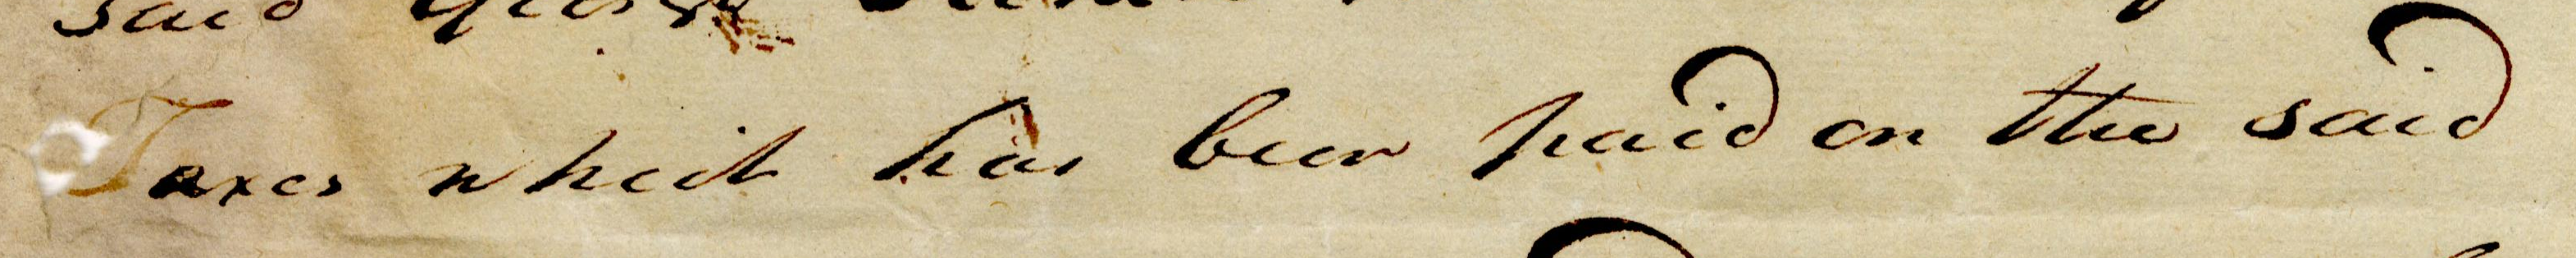Taxes which has been paid in the said
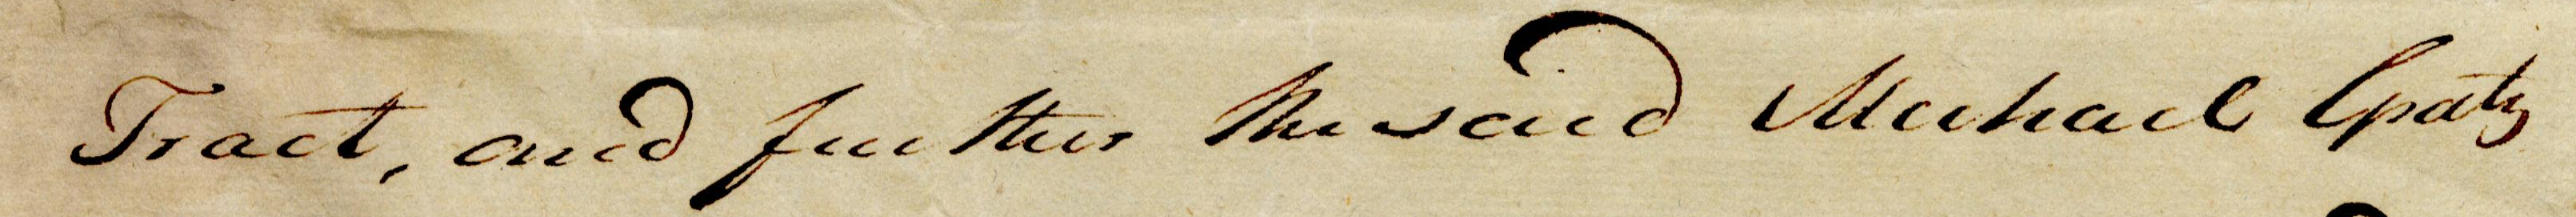Tract, and further the said Michael Gratz
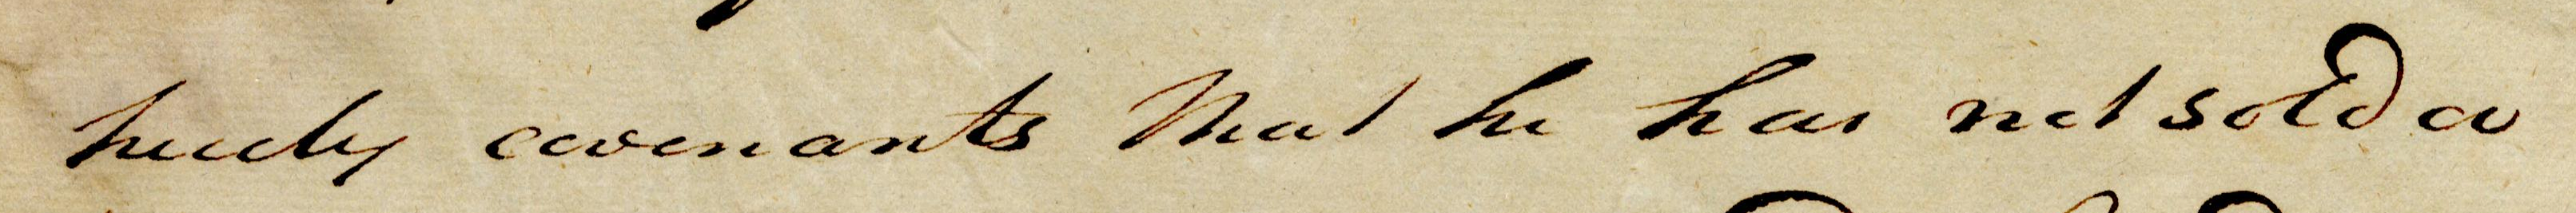hereby covenants that he has not sold or
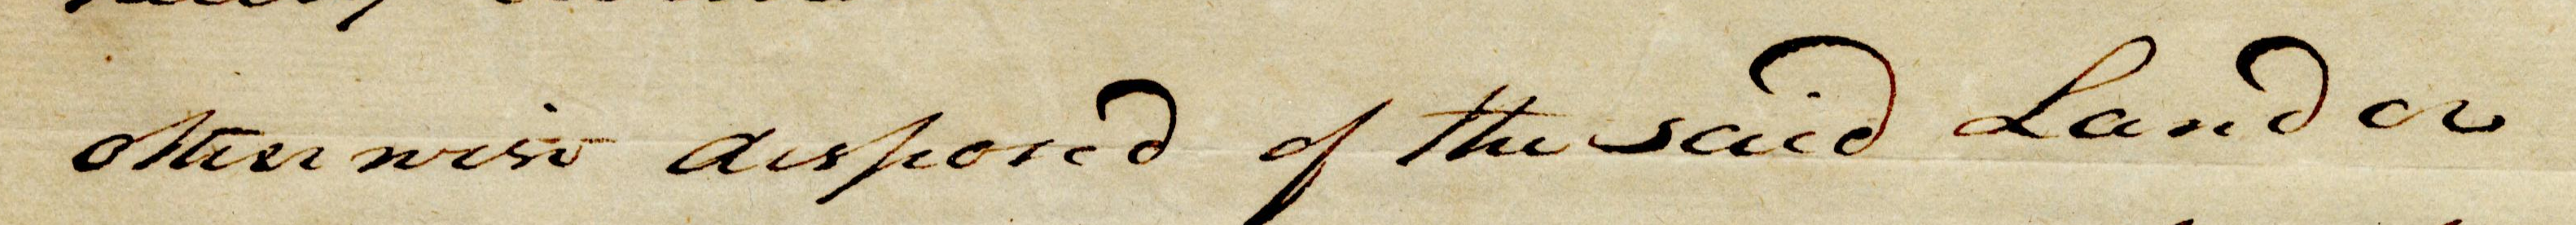otherwise disposed of the said Land or
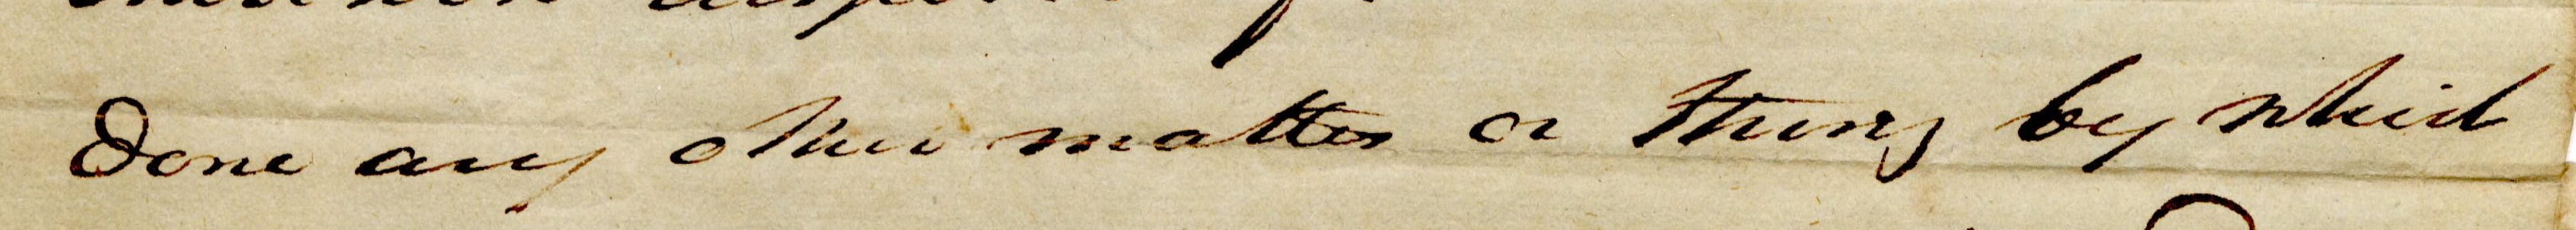done any other matter or thing by which
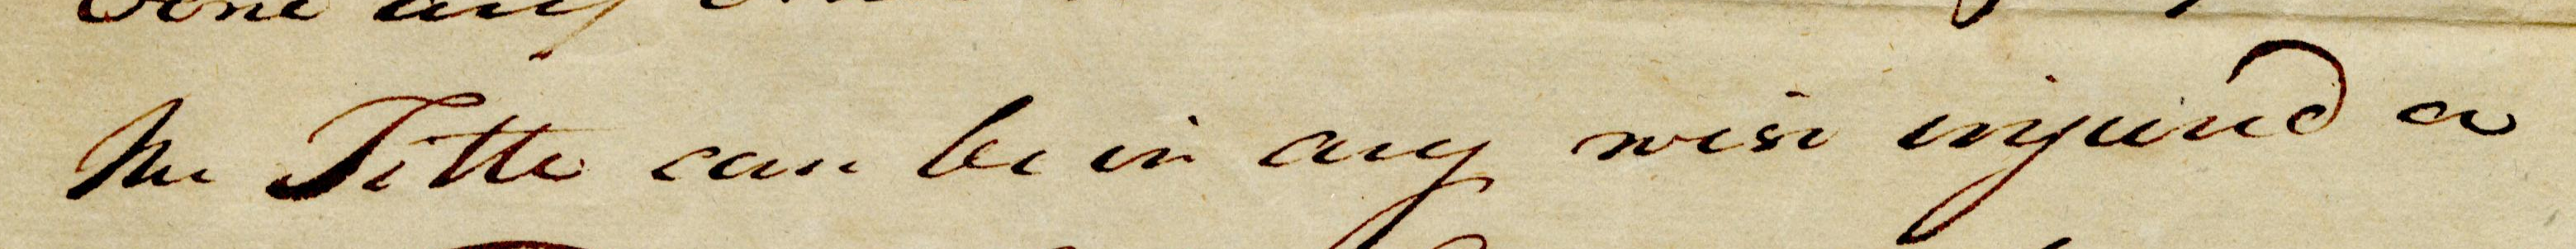the Title can be in any wise injured or
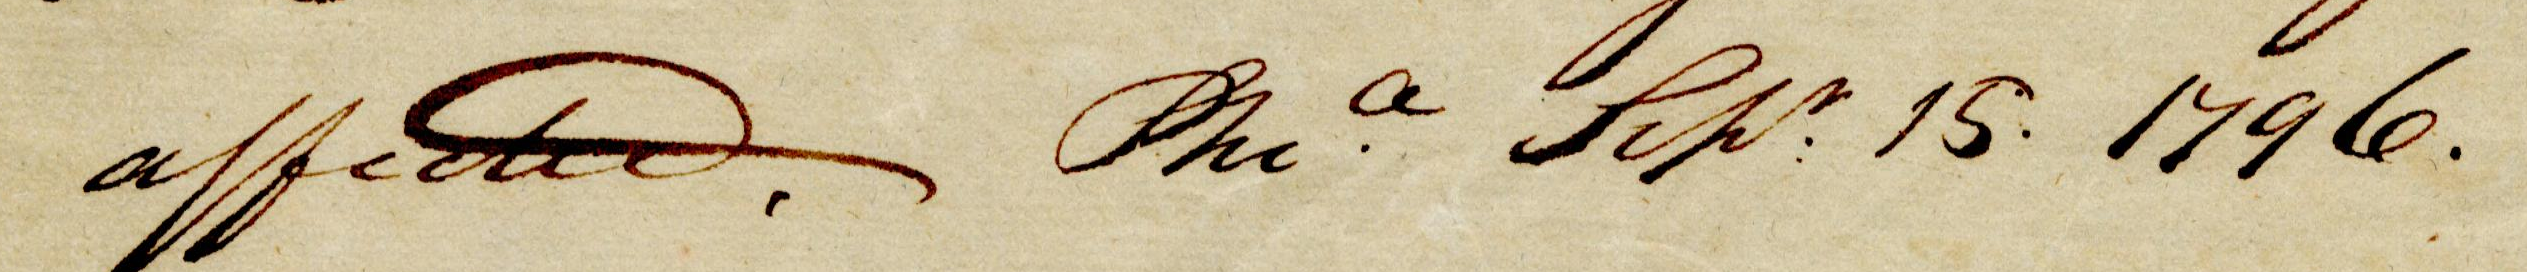affected. Phi^a. Sep^r: 15. 1796.
